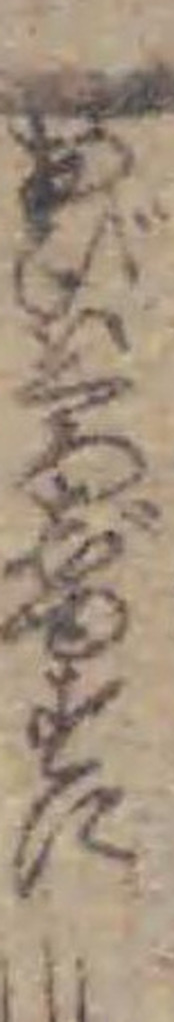おびはくろじゅすに
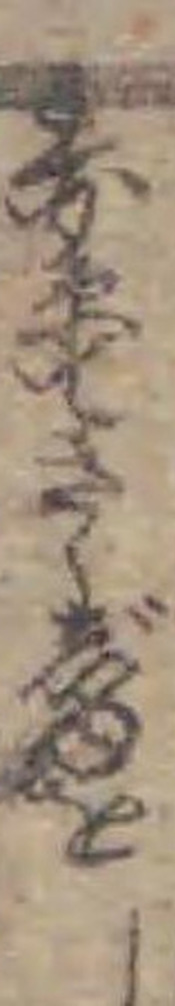赤糸てきくじゆを
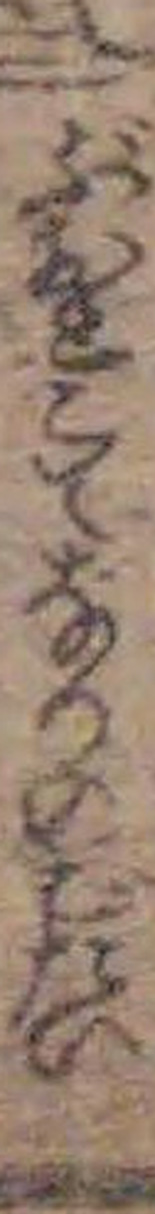ぶをとこてなりのごたい
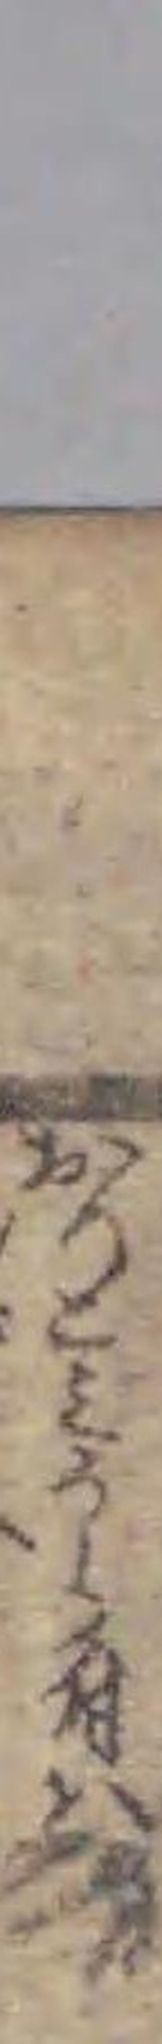おりこみうら付は
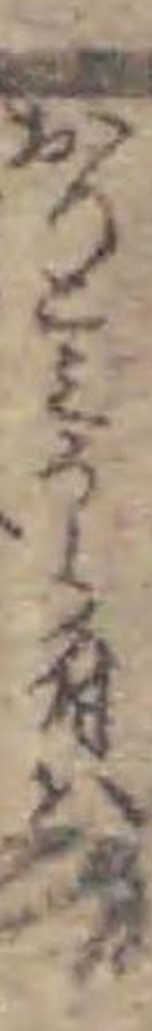おりこみうら付は
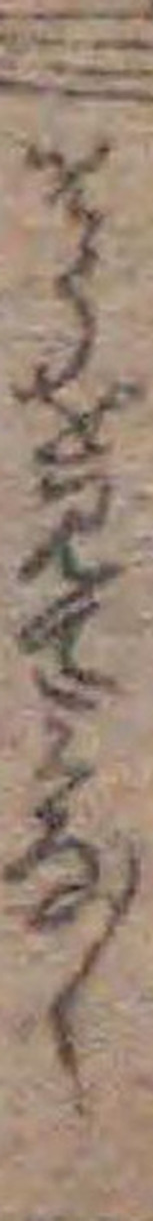そうを見てみな〳〵
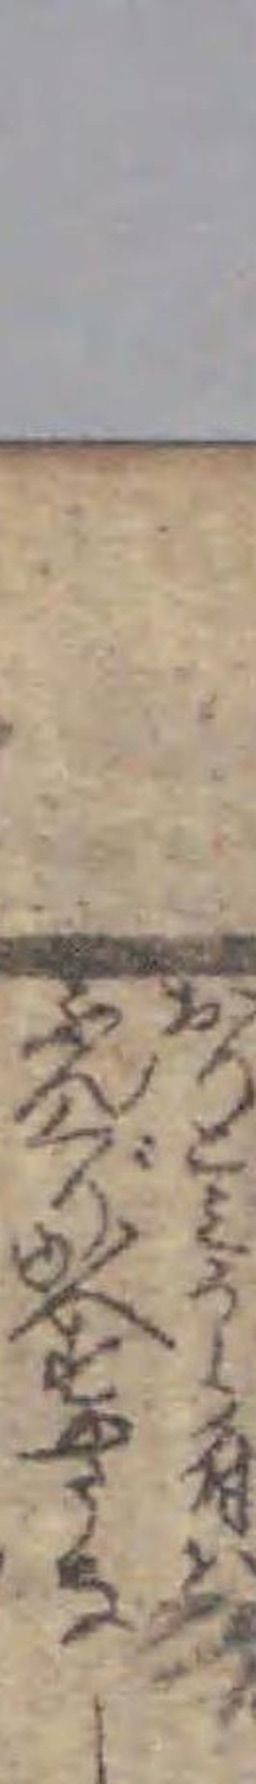ふんぐりかへすよやうな
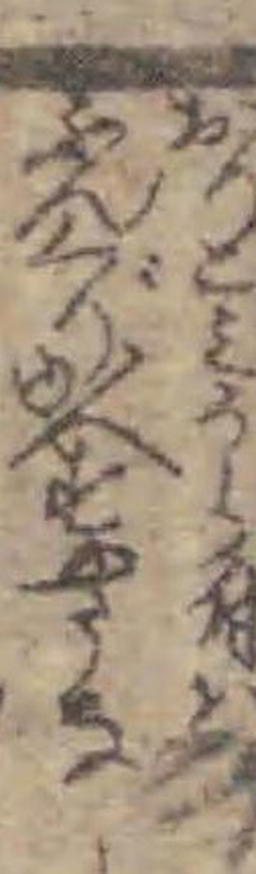ふんぐりかへすよやうな
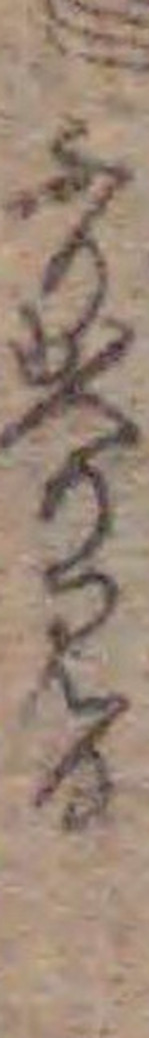ふりかへり見る
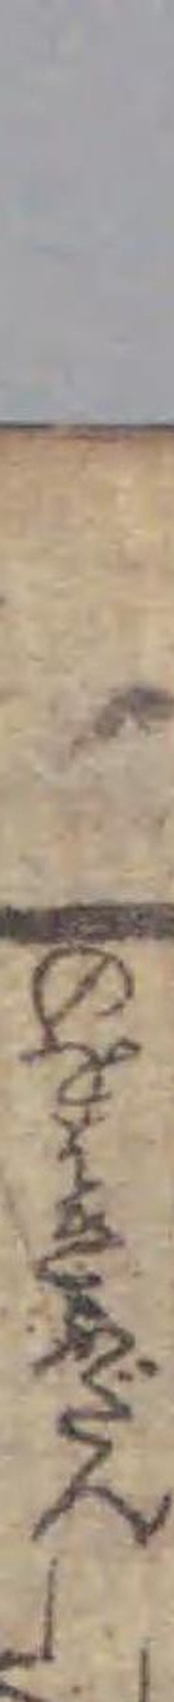のをはきふだん
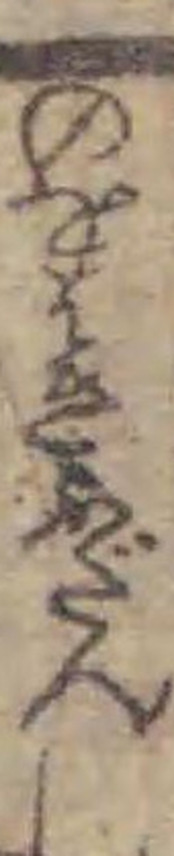のをはきふだん
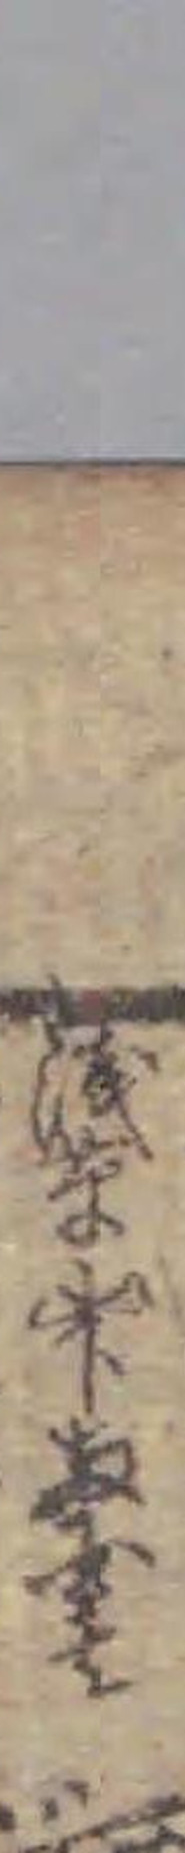浅草山下両国其
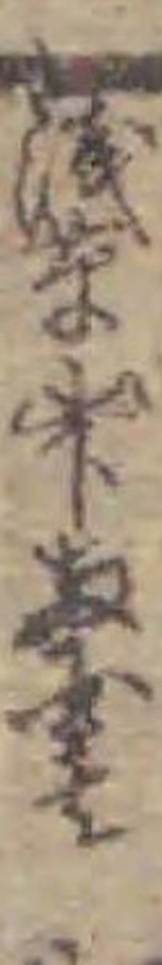浅草山下両国其
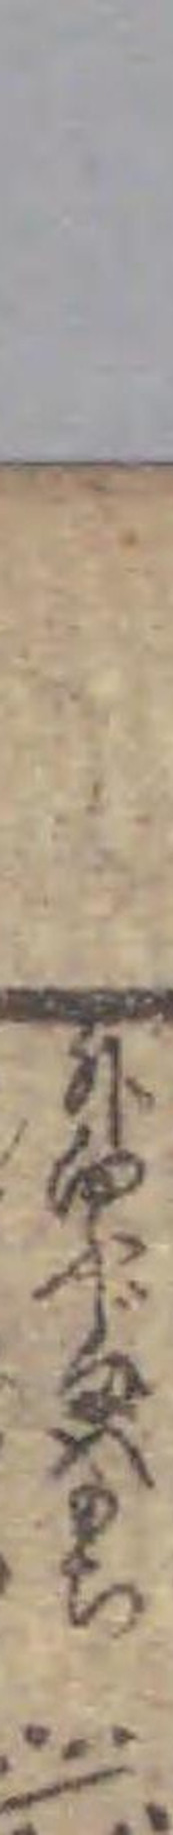外向ふじまはもち
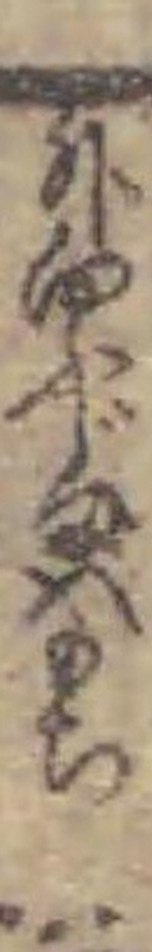外向ふじまはもち
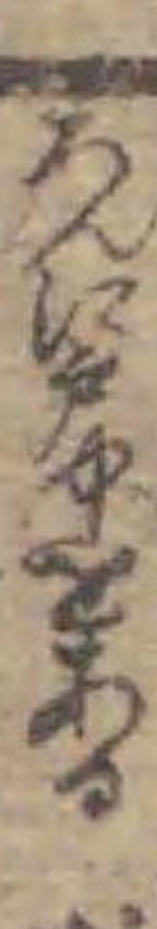ろん江戸中をある
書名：通風伊勢物語 : 3巻
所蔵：国立国会図書館 National Diet Library, JAPAN
